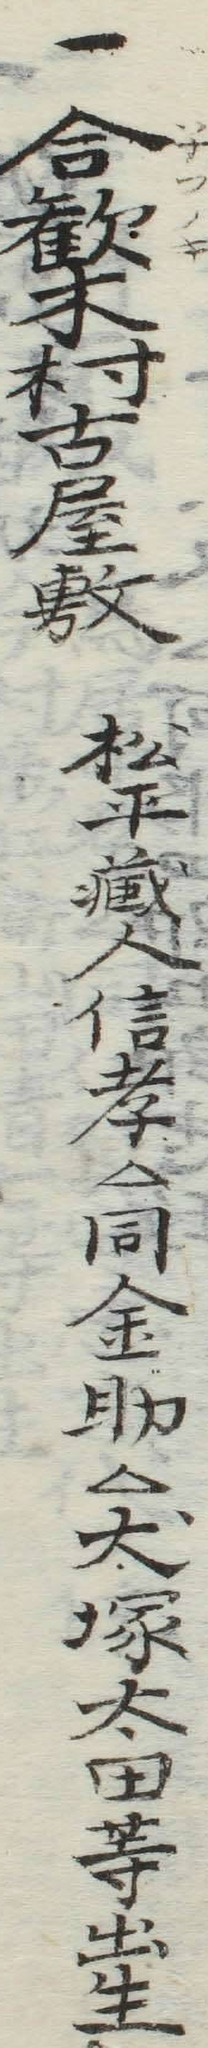一合歓木村古屋敷松平蔵人信孝△同金助△犬塚太田等出生
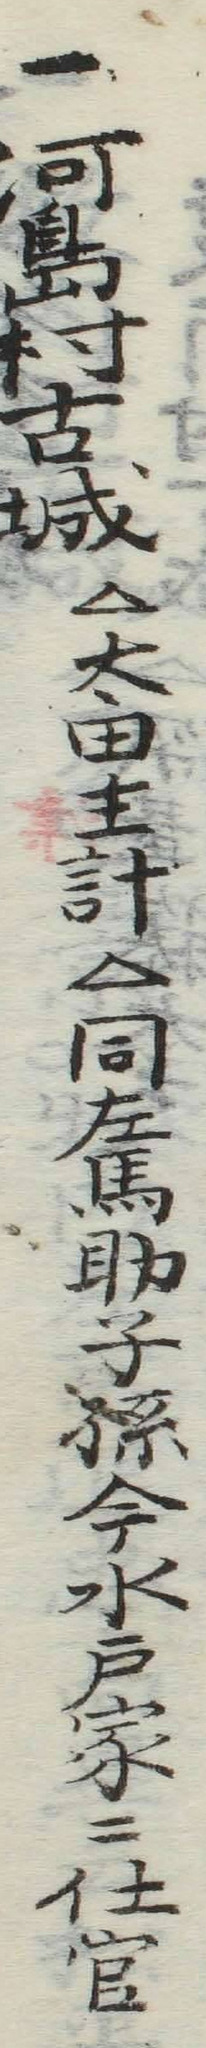一河島村古城△太田主計△同左馬助子孫今水戸家ニ仕官

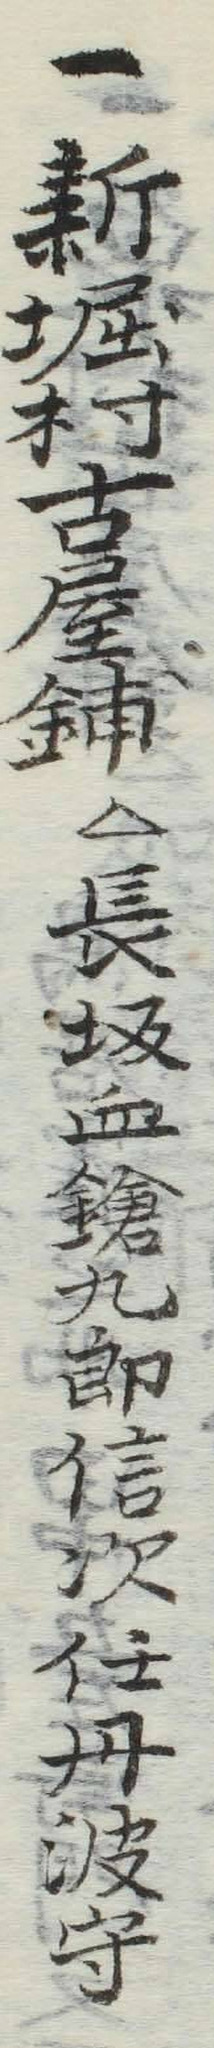一新堀村古屋鋪△長坂血鎗九郎信次任丹波守

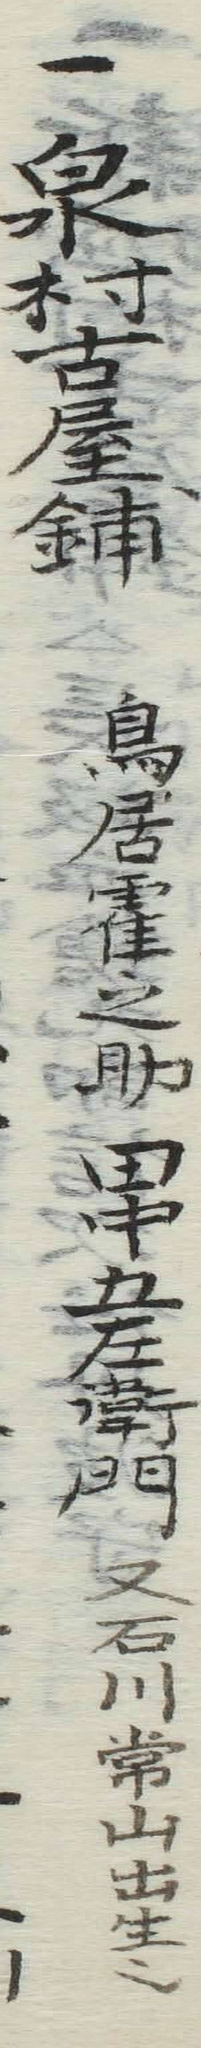一泉村古屋鋪鳥居霍之助田中五左衛門又石川常山出生也
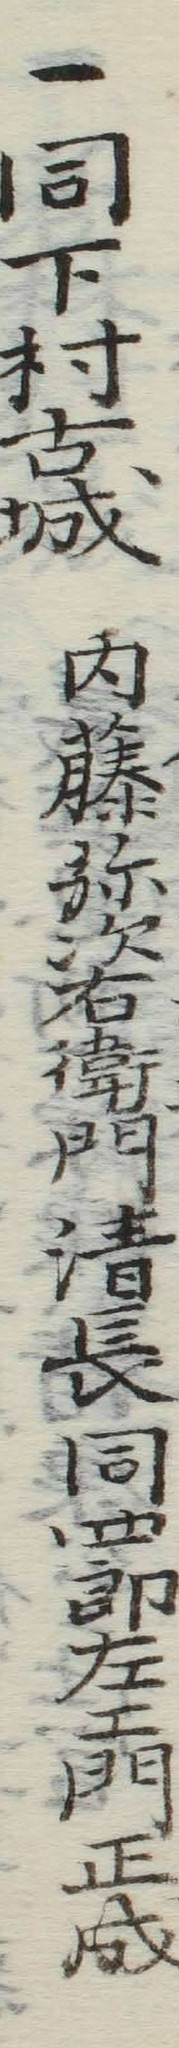一同下村古城内藤弥次右衛門清長同四郎左エ門正成

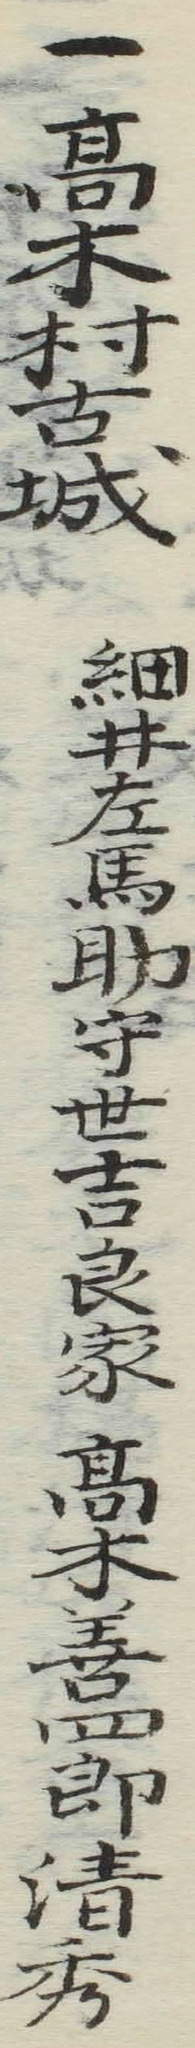一高木村古城細井左馬助守世吉良家高木善四郎清秀
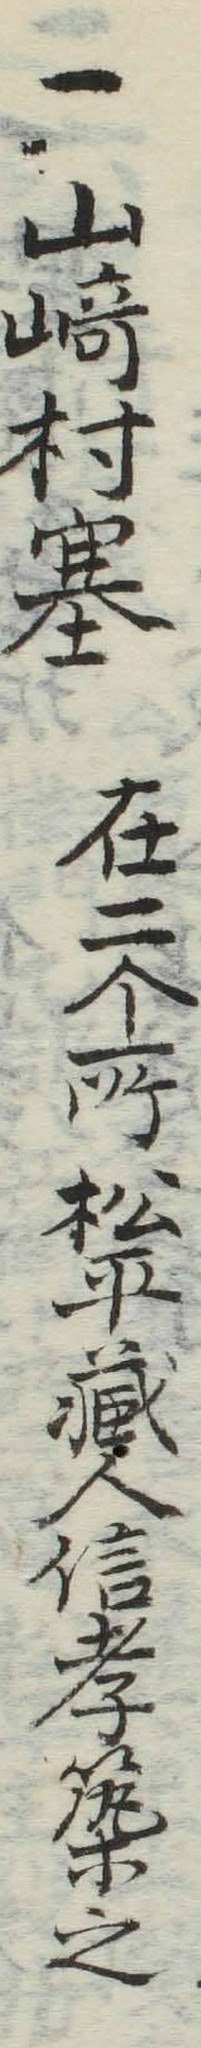一山崎村塞在二箇所松平蔵人信孝築之
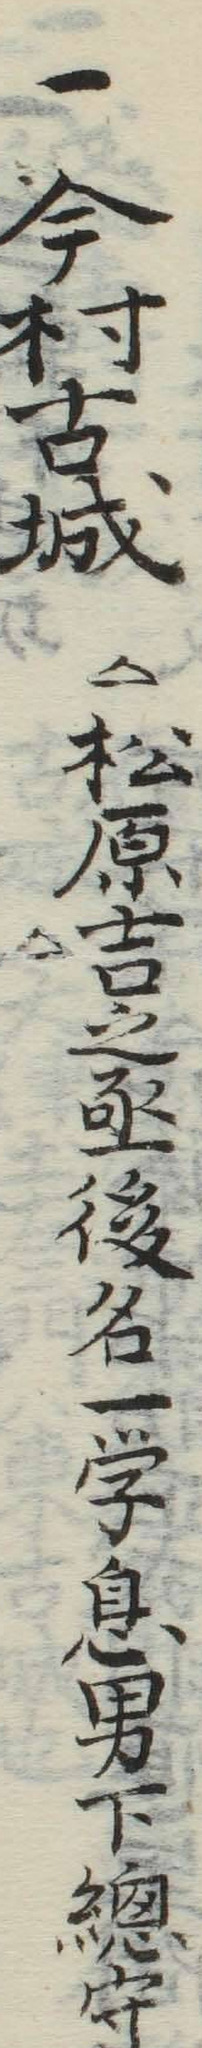一今村古城△松原吉之丞後名一学息男下総守
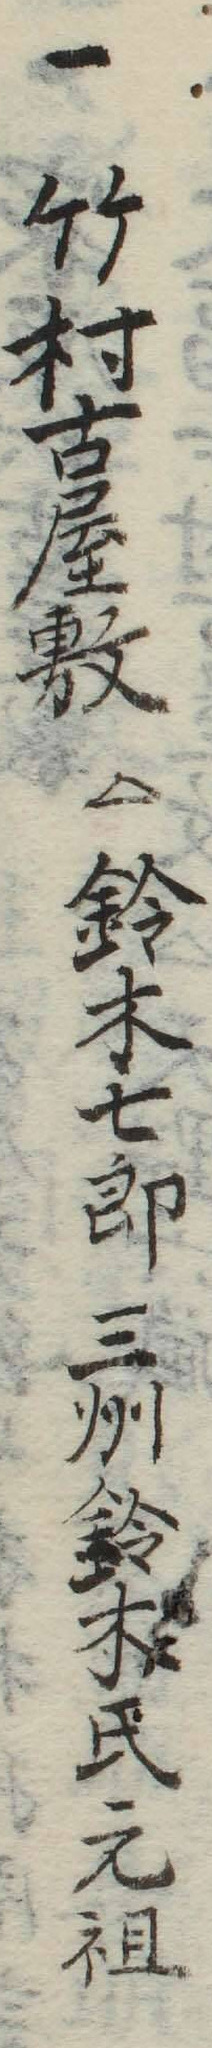一竹村古屋敷△鈴木七郎三州鈴木氏元祖

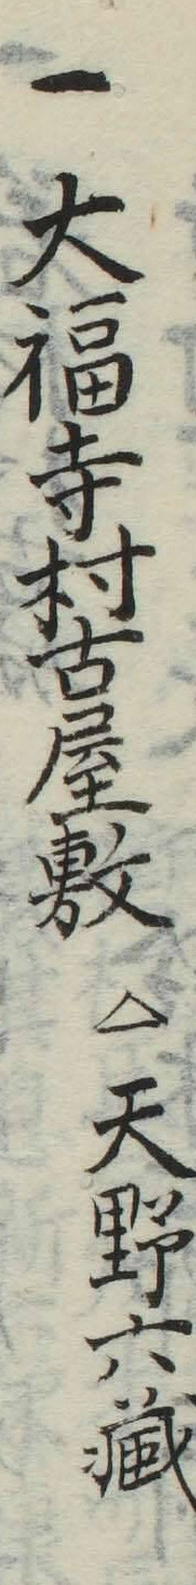一大福寺古屋敷△天野六蔵
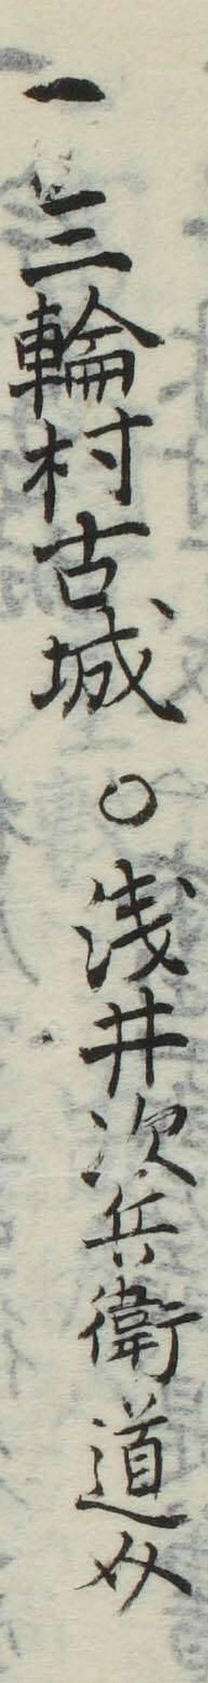一三輪村古城○浅井次兵衛道介
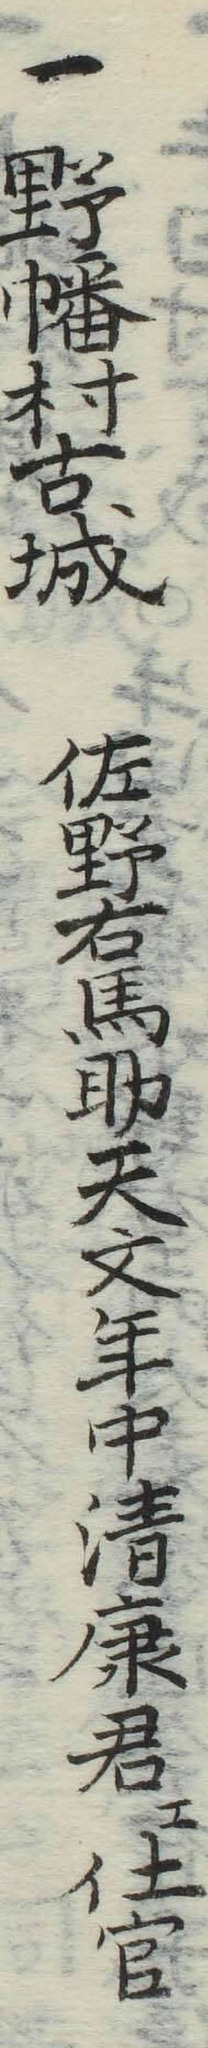一野幡村古城佐野右馬助天文年中清康君エ仕官
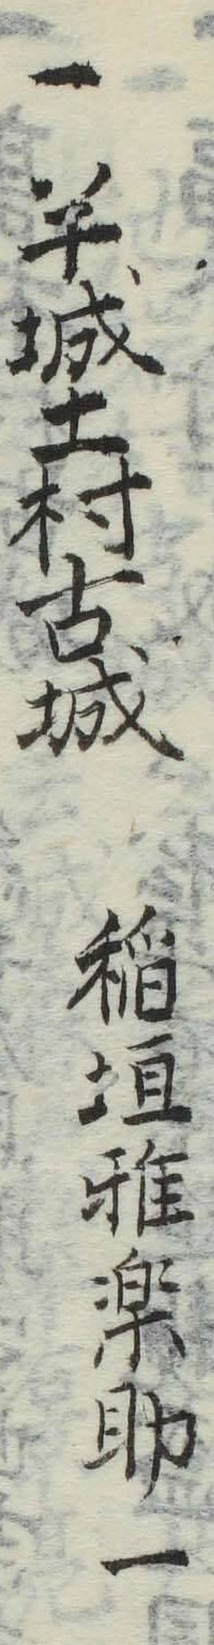一半城土村古城稲垣雅楽助一
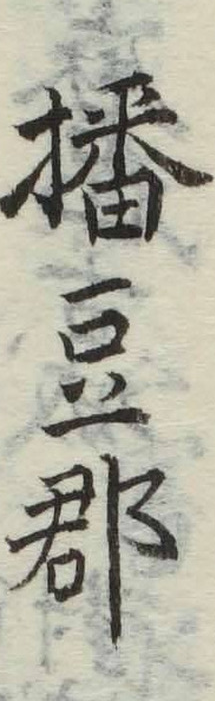播豆郡
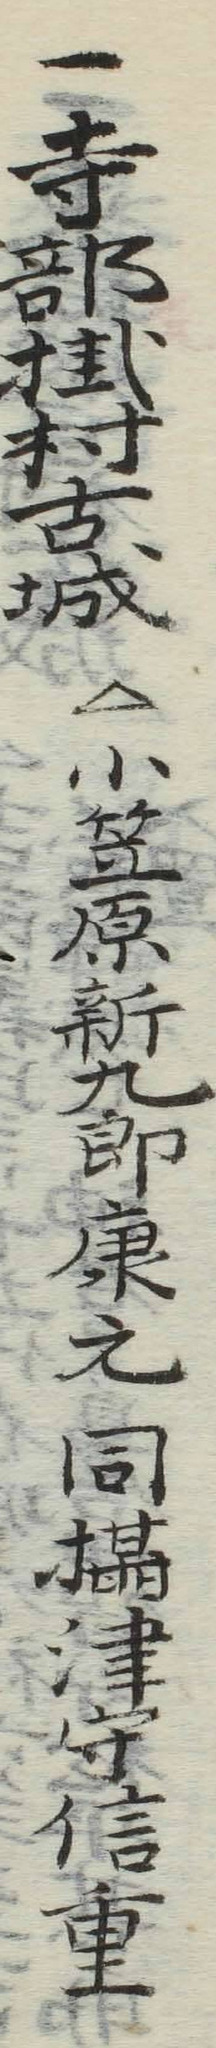一寺部掛村古城△小笠原新九郎康元同摂津守信重
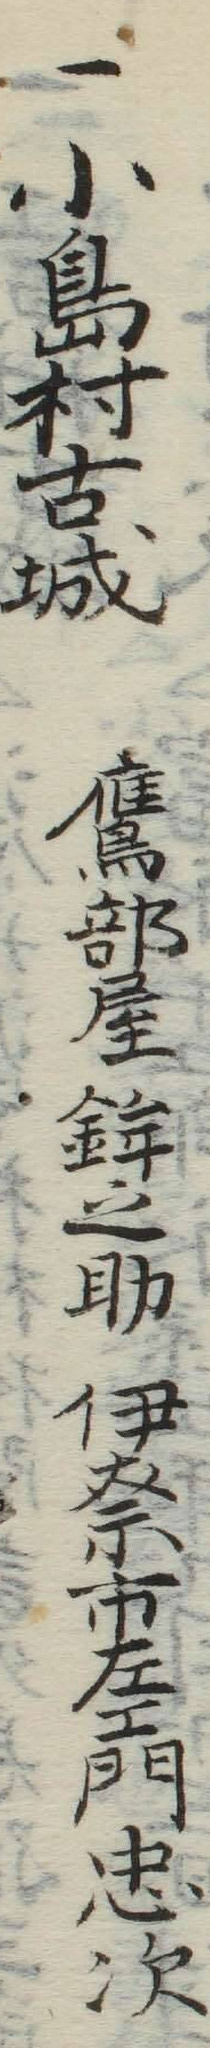一小島村古城鷹部屋鉾之助伊奈市左エ門忠次
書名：三河国二葉松
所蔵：国文学研究資料館
